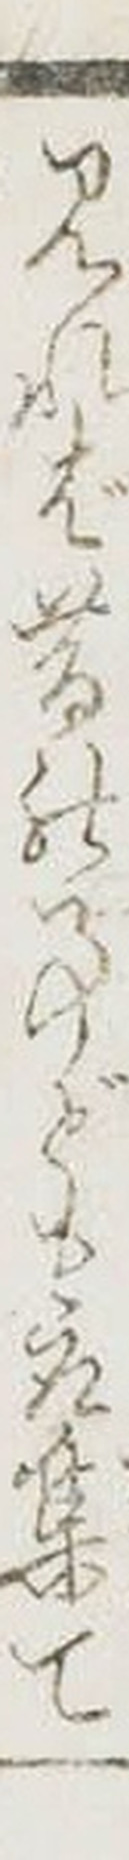見れば昔の事ども取集て
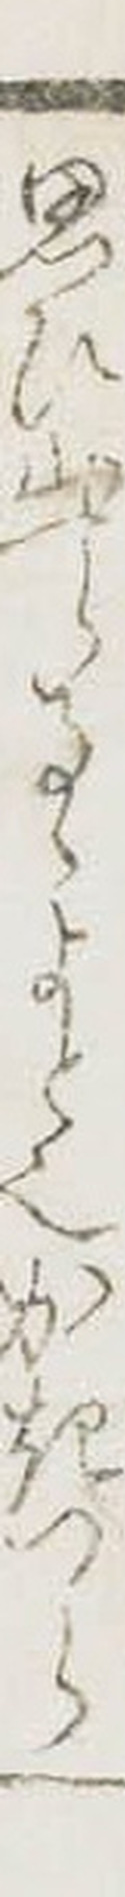思ひ出らるゝよと也かきつら
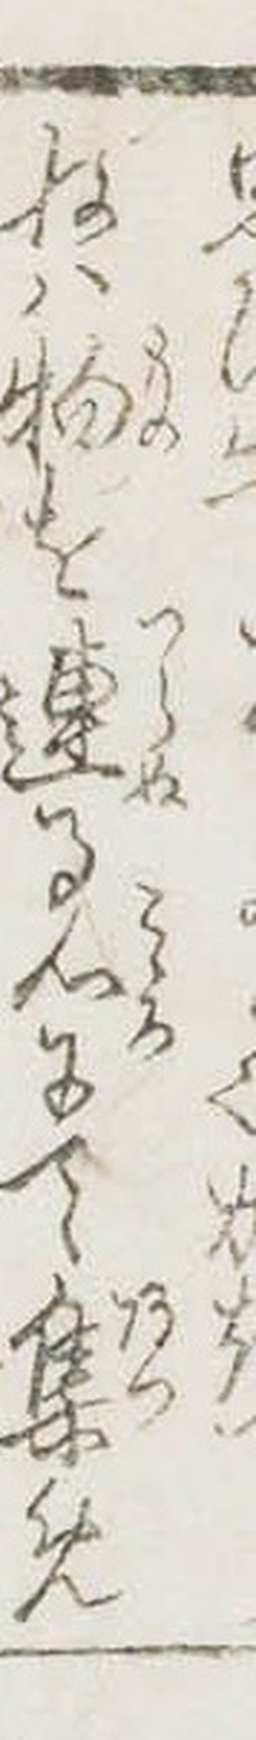ねは物を連る心にて集め
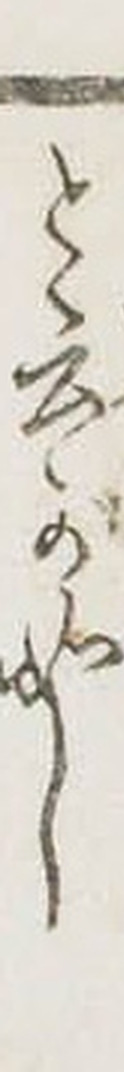と云が如し
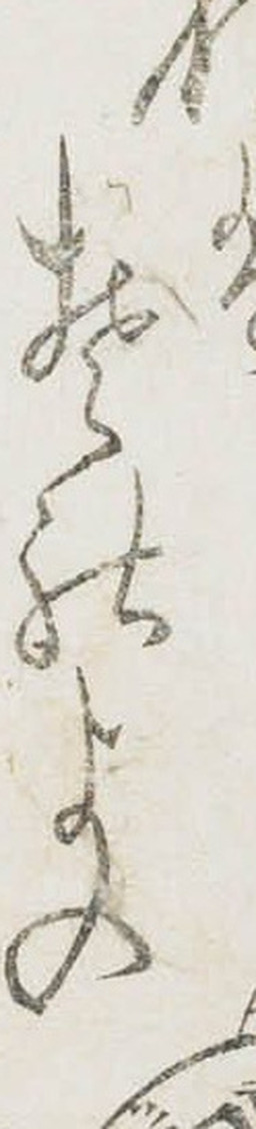そのよの
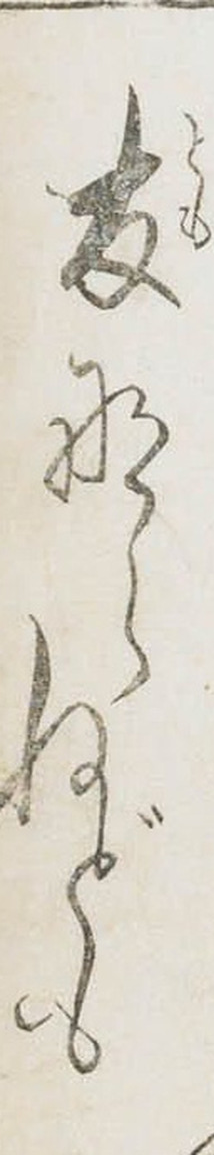友ならねども
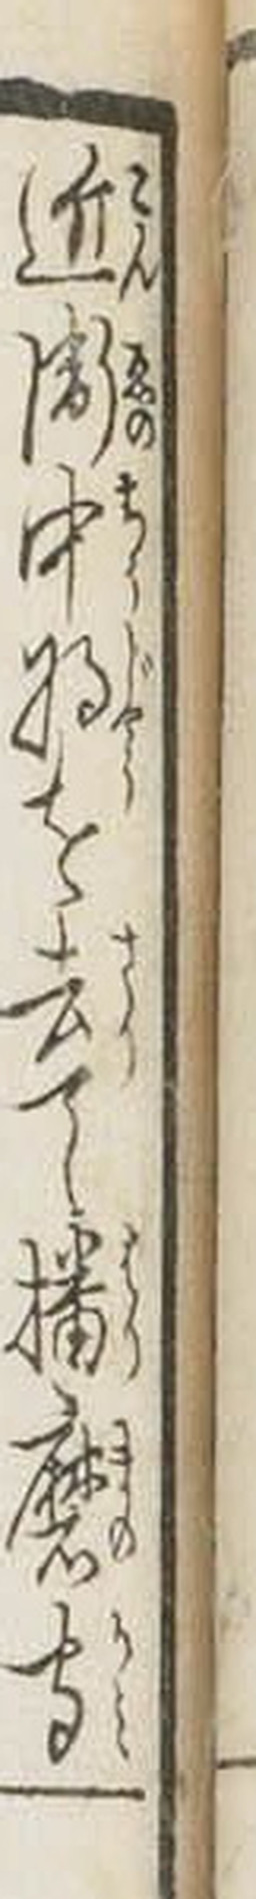近衛中将を去て播磨守
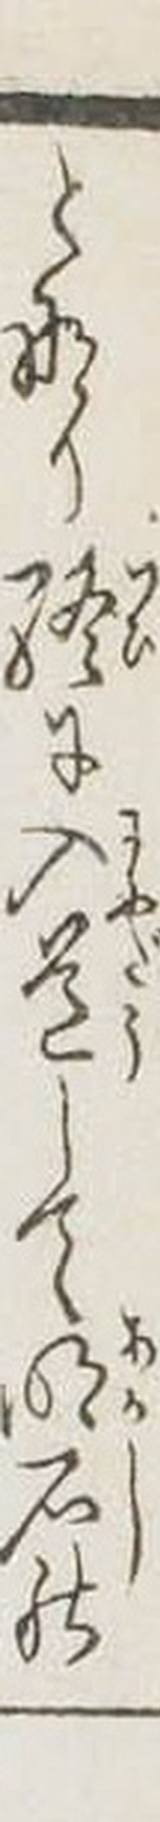となり終に入道して明石の
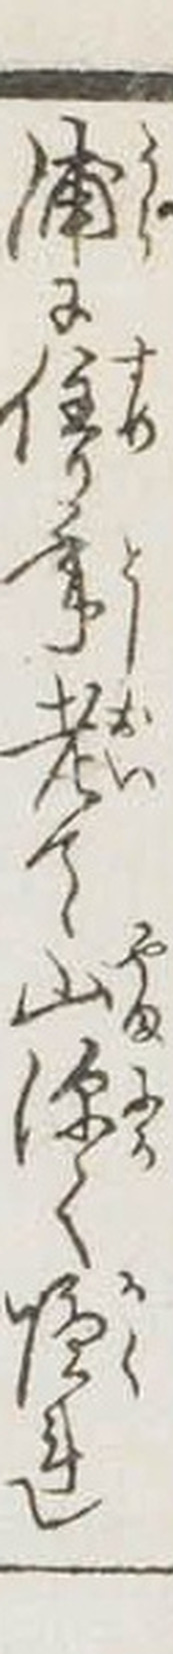浦に住り年老て山深く隠れ
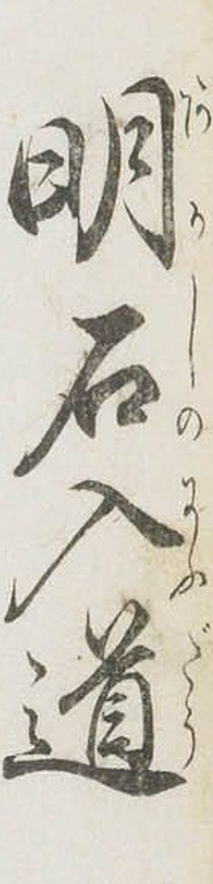明石入道
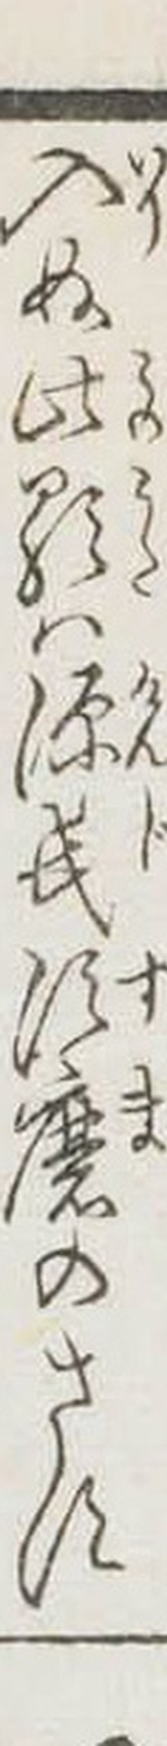入ぬ此歌は源氏須磨のさす
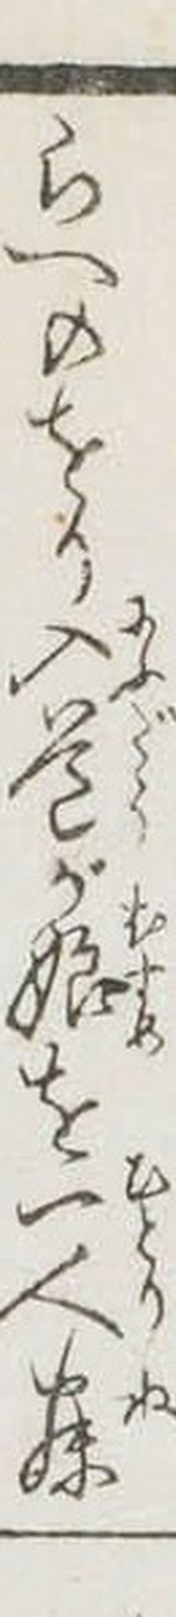らへのをり入道が娘を一人寐
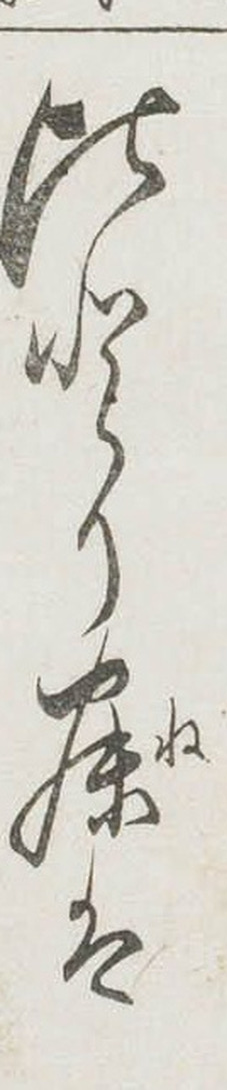ひとり寐は
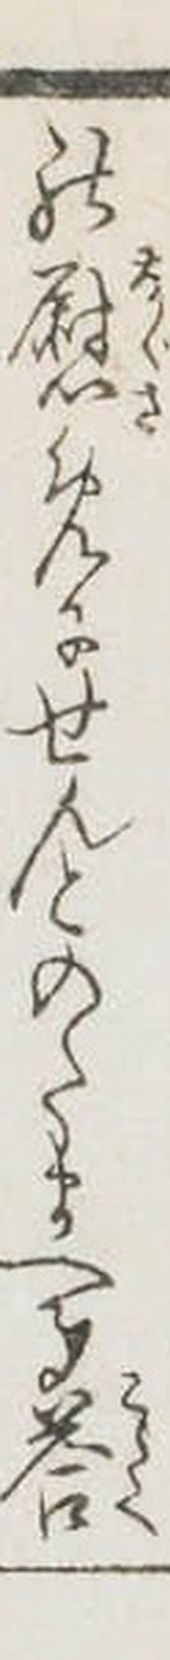の慰めにせんとのたまへる答
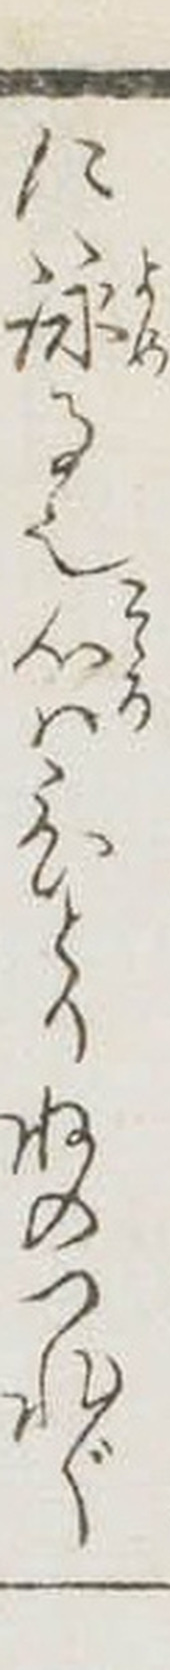に詠る也心はひとりねのつれ〴〵
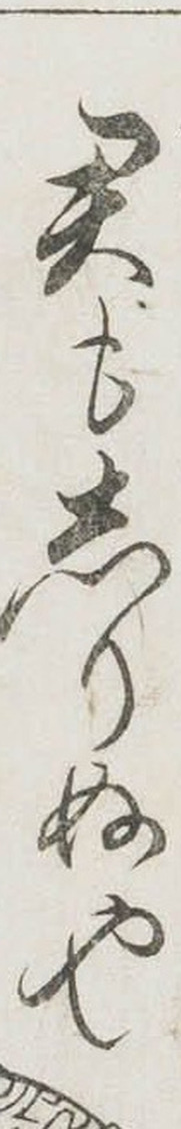君もしりぬや
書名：源氏百人一首
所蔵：東京学芸大学教育コンテンツアーカイブ
